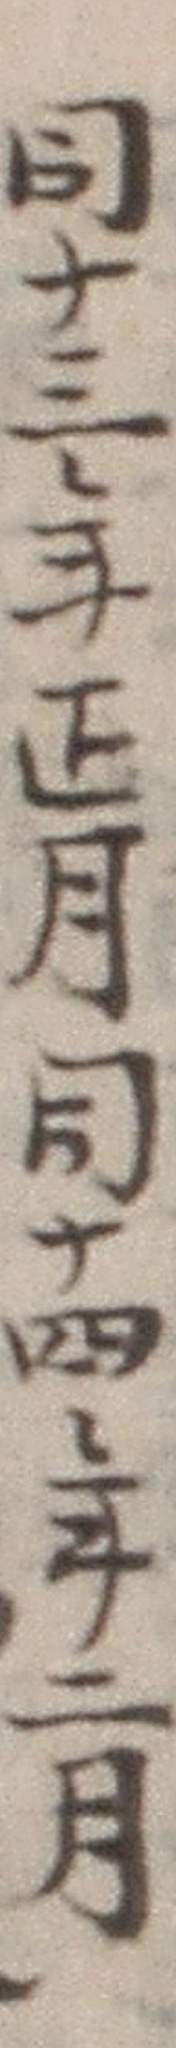同十三年正月同十四年二月
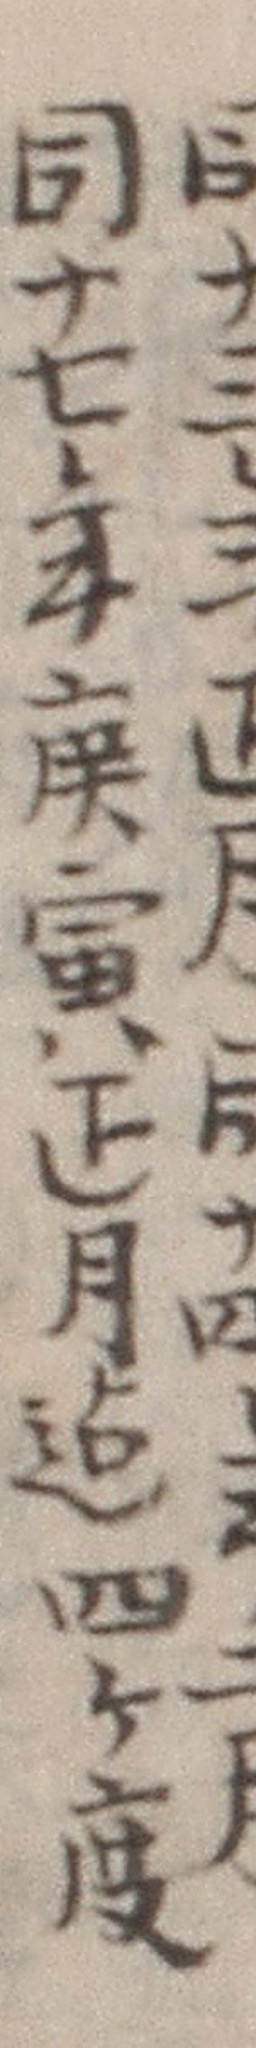同十七年庚寅正月迄四ヶ度
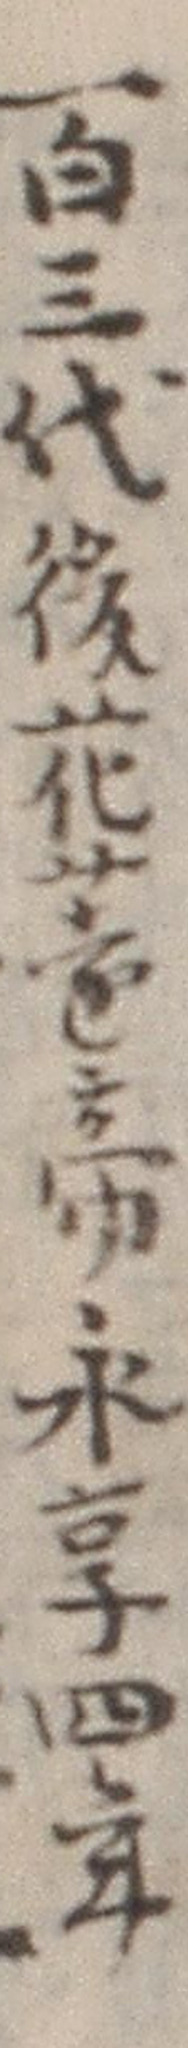百三代後花帝永享四年
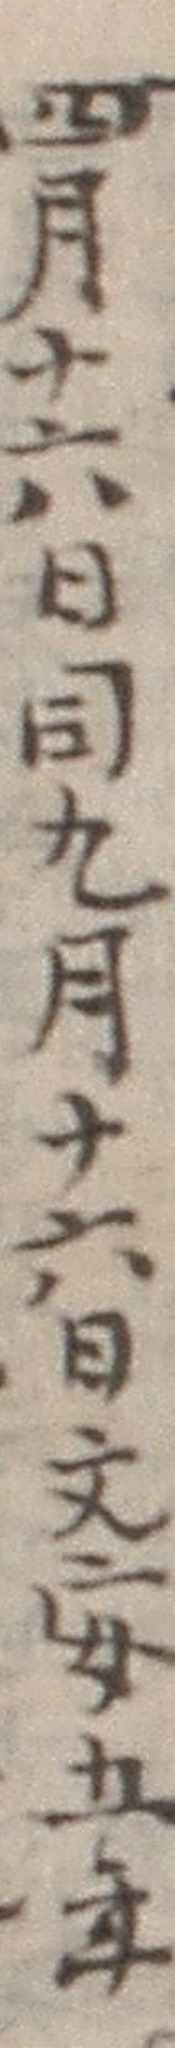四月十六日同九月十六日文安五年
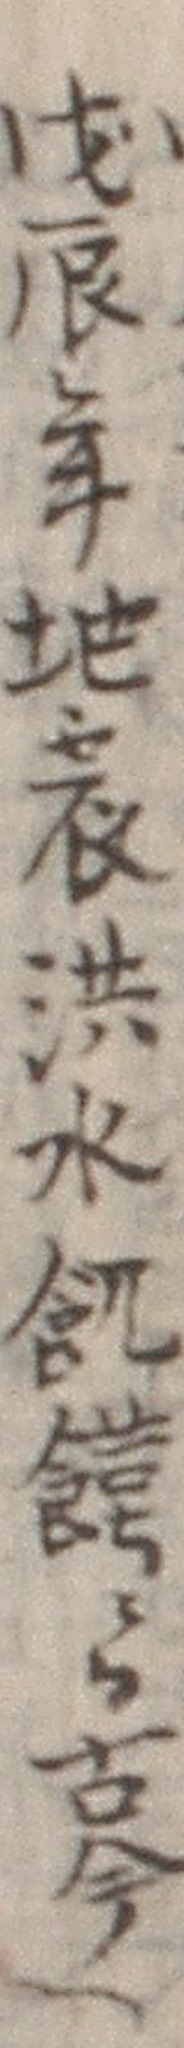戊辰年地震洪水飢饉にて古今
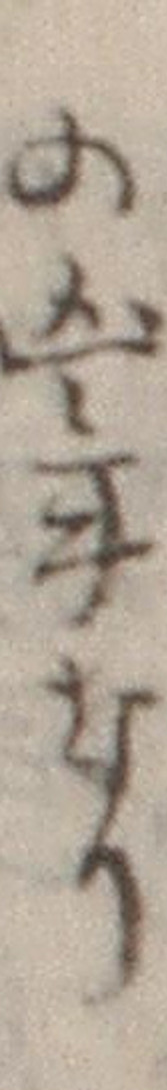の凶年なり
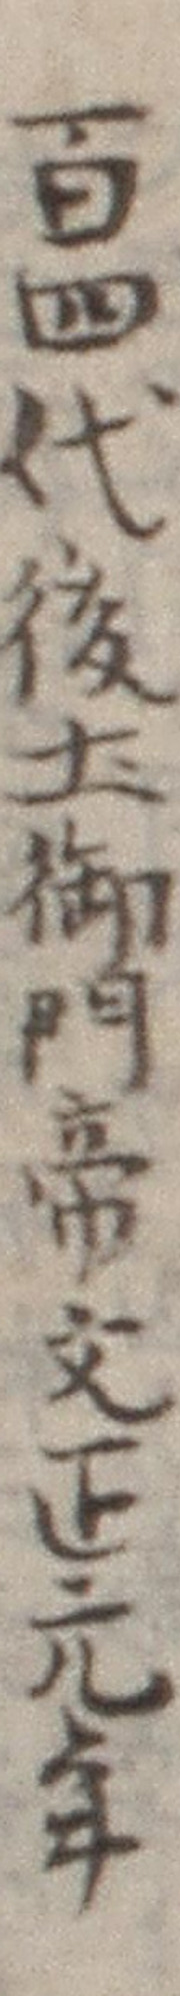百四代後土御門帝文正元年
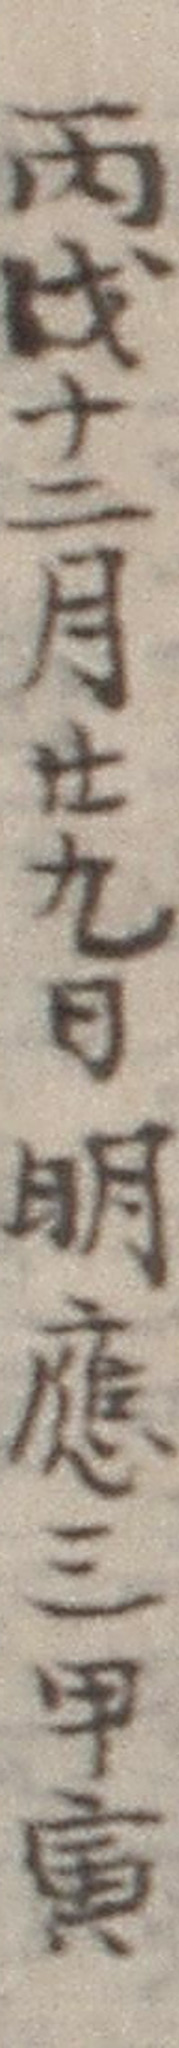丙戊十二月廿九日明應三甲寅
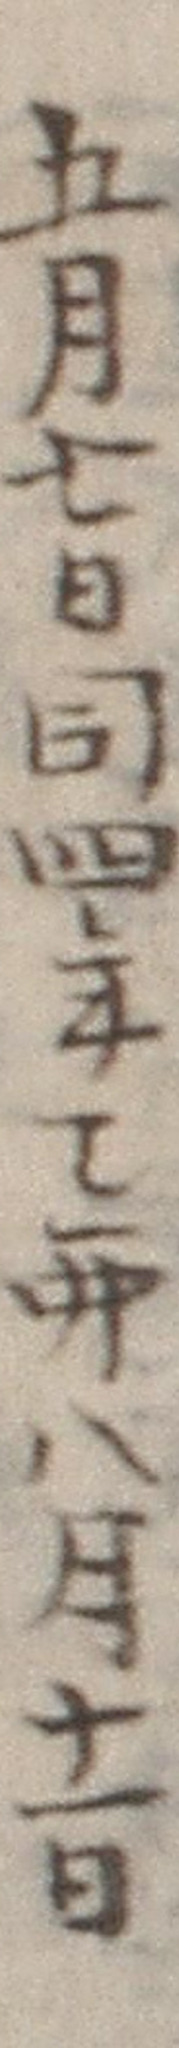五月七日同四年乙卯八月十一日
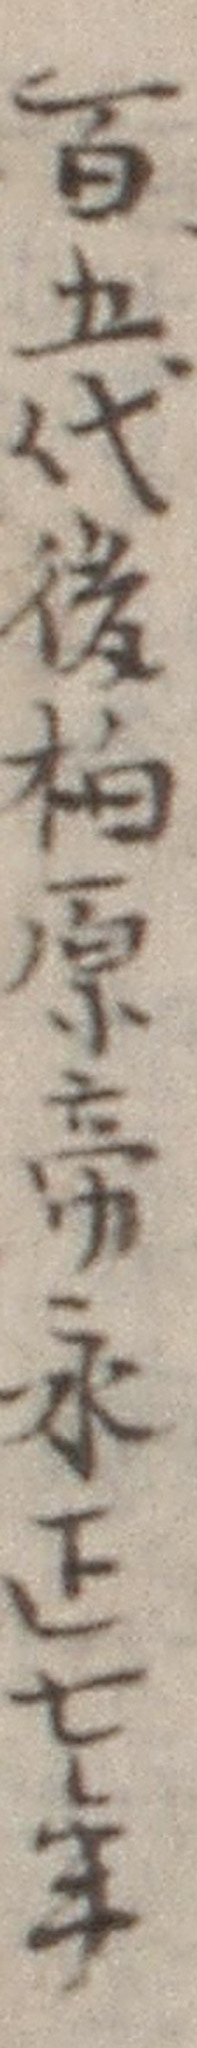百五代後柏原帝永正七年
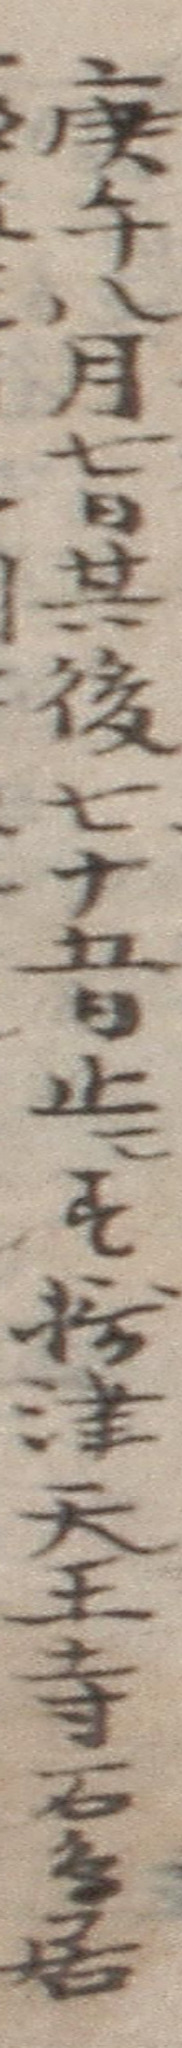庚午八月七日其後七十五日止ま？す摂津天王寺石鳥居
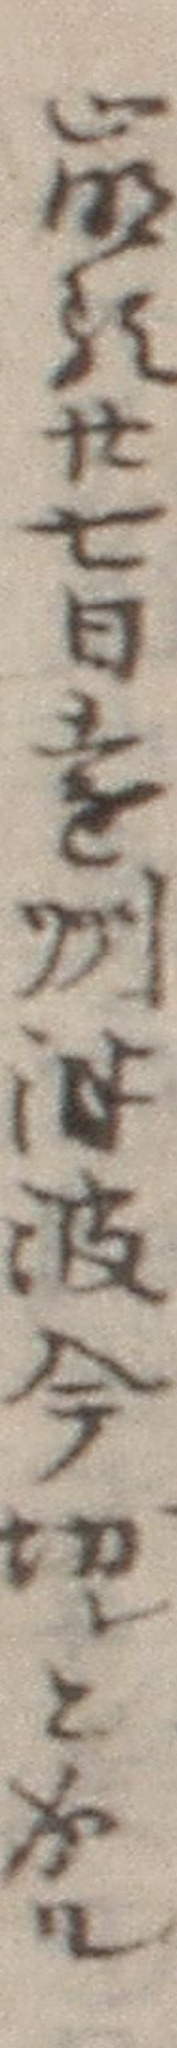崩る廿七日遠州津波今切と成る
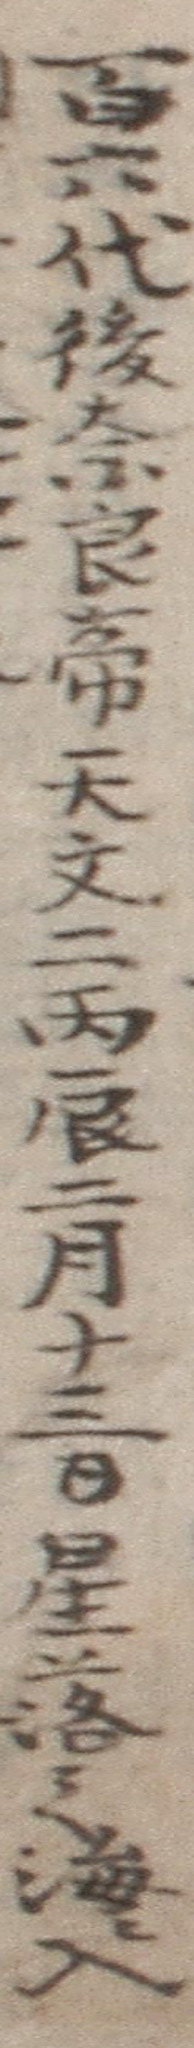百六代後奈良帝天文二丙辰二月十三日星落て海入
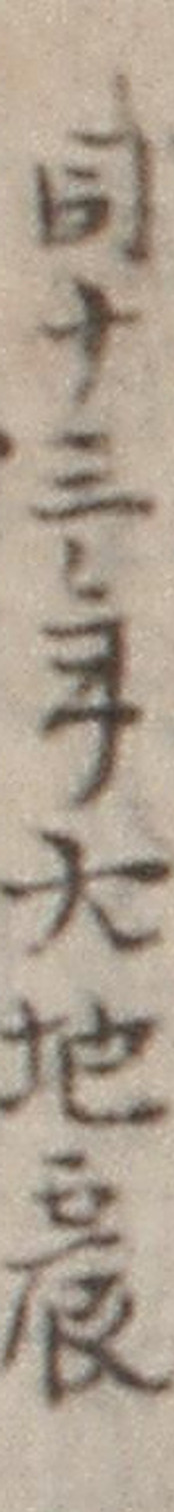同十三年大地震
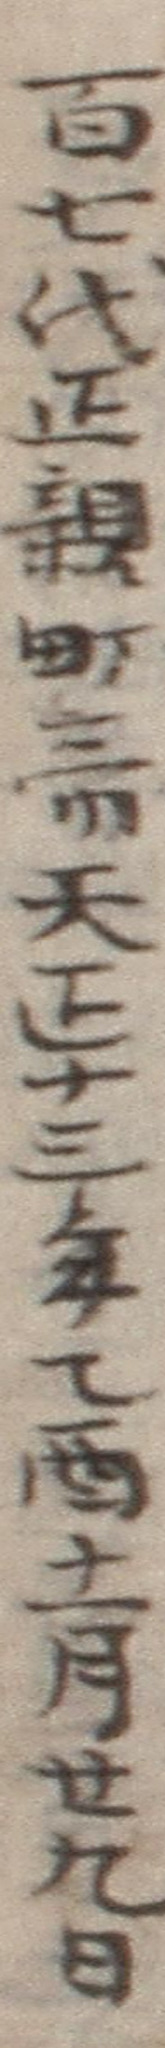百七代正親町帝天正十三年乙酉十一月廿九日

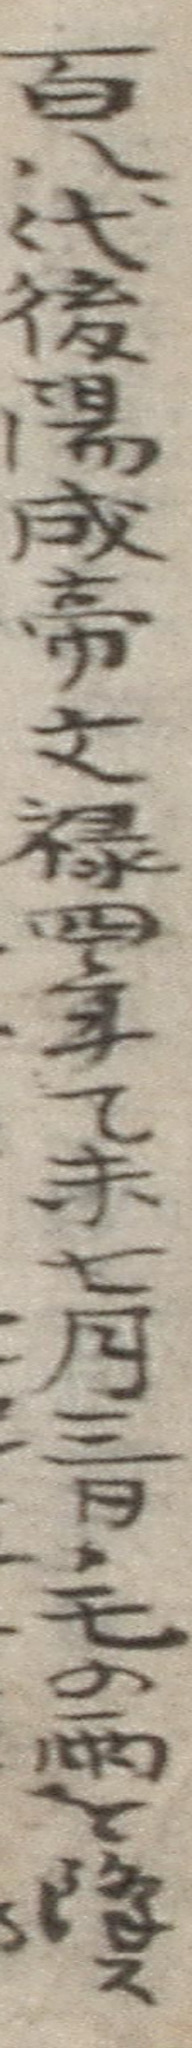百八代後陽成帝文禄四年乙未七月三日毛？の雨を降す
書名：諸國大地震年代記末代噺種
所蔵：東京大学地震研究所図書室 Earthquake Research Institute Library, The University of Tokyo, JAPAN
